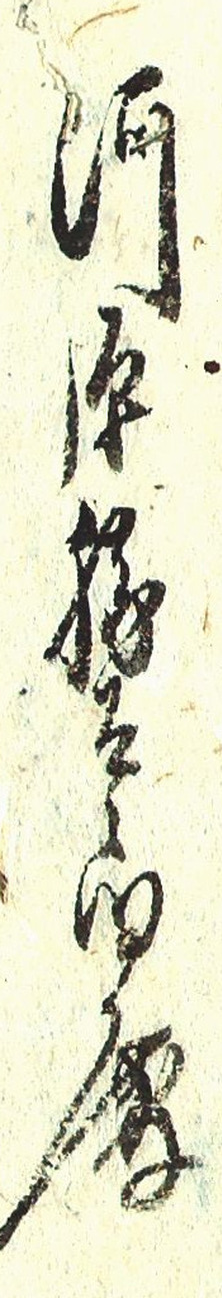河原勝太郎殿

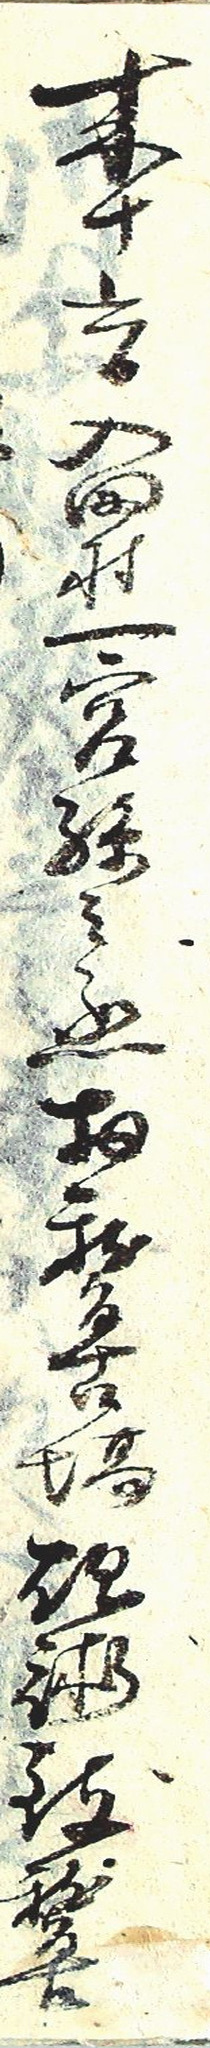来十六日入田村一宮孫之丞於稽古場炮術致稽古
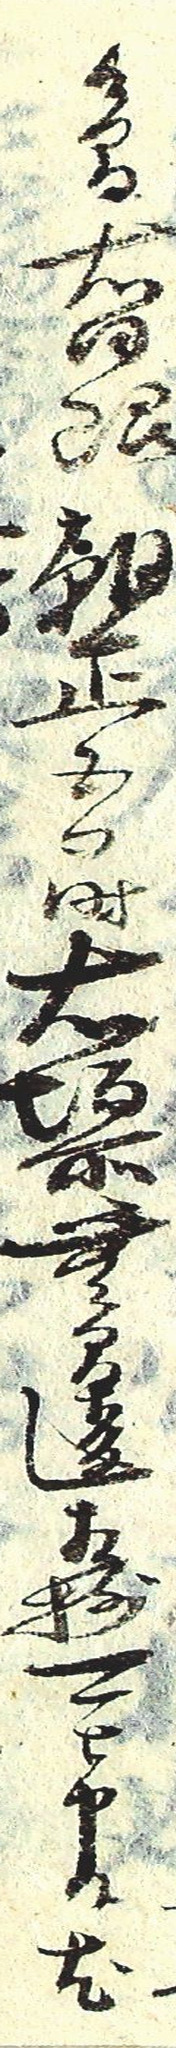候間右日限朝正五つ時右場所に無間違相揃可被申候尤
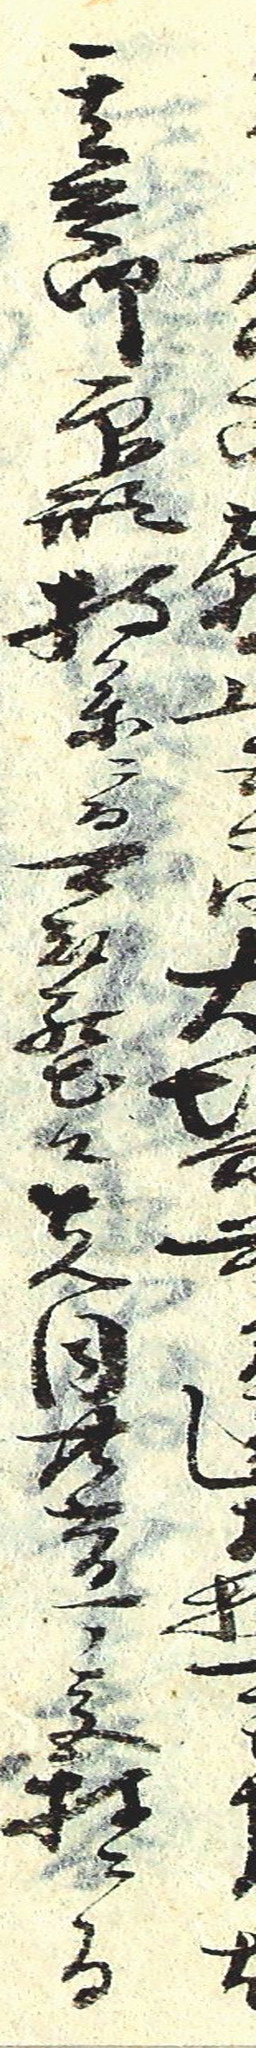其節印形持参にて可被罷出候先月廿六日一ノ宮村にて
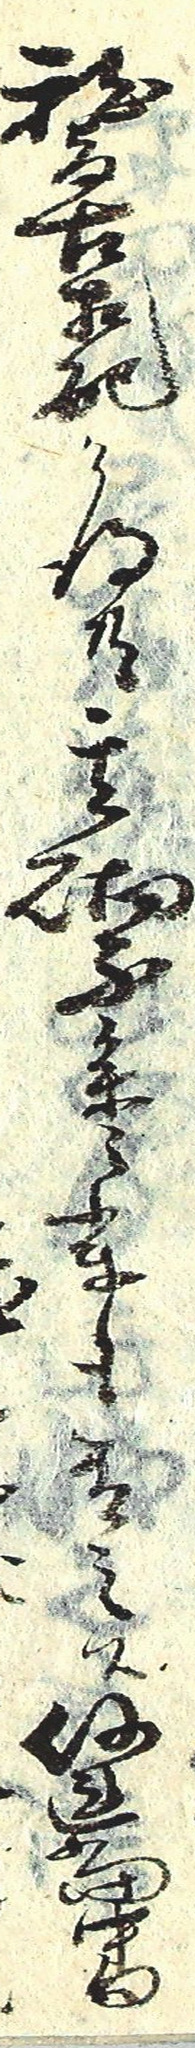稽古相配候得共其砌不参之輩も有之候何れ当番
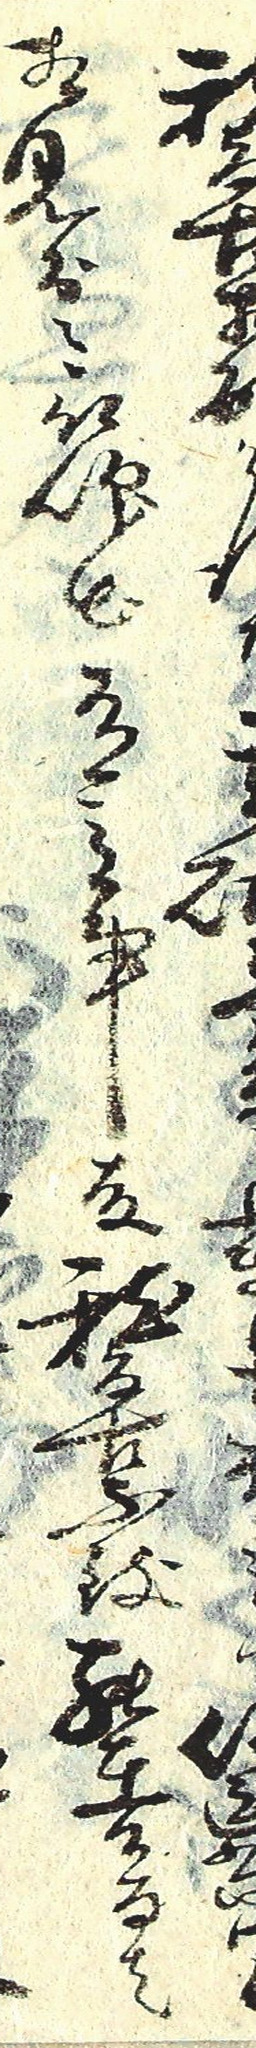御見分に被仰出有之候事故稽古不致罷在候ては
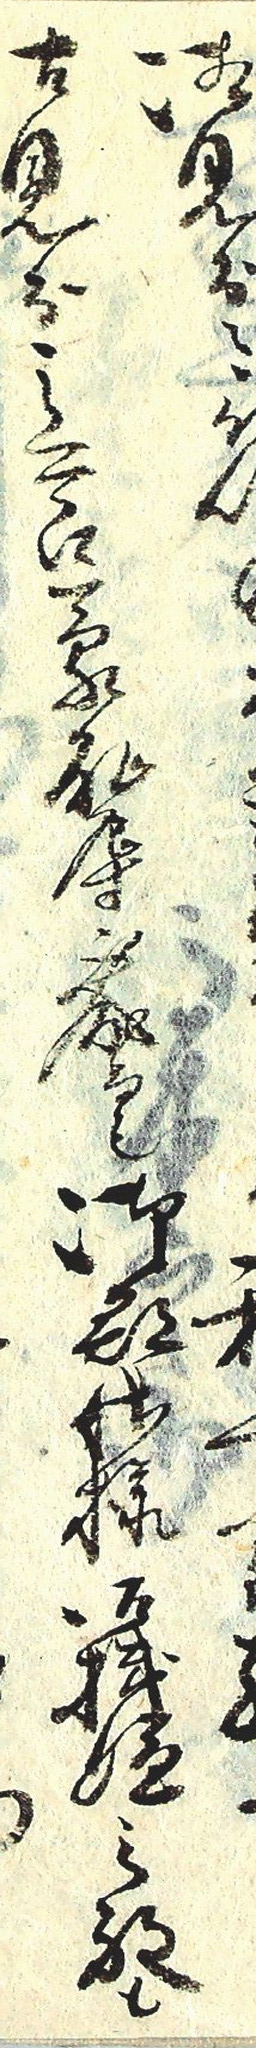御見分之節蒙恥辱被成而已御郡代様御機嫌之程も
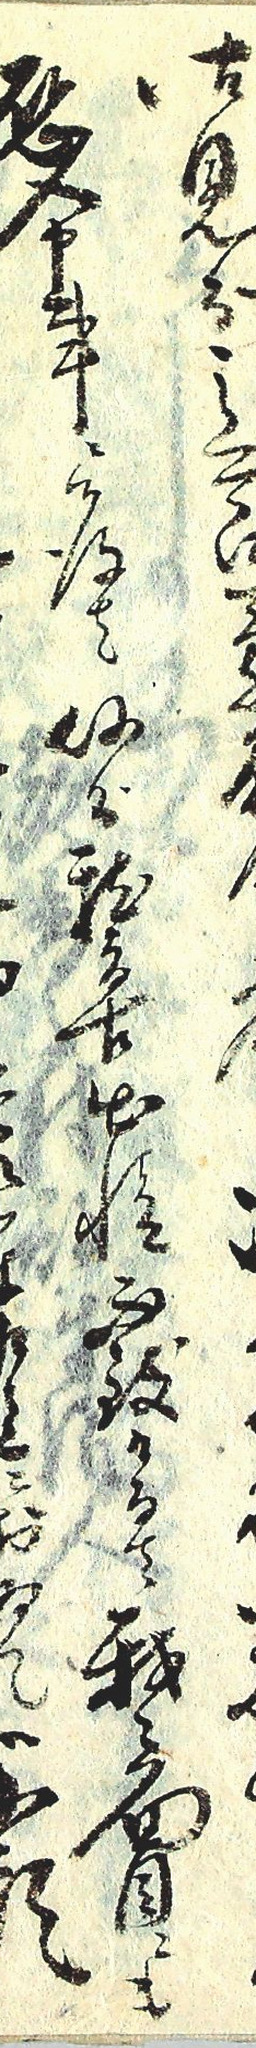恐入申事に候得は何分稽古出情不致候ては我々面目にも
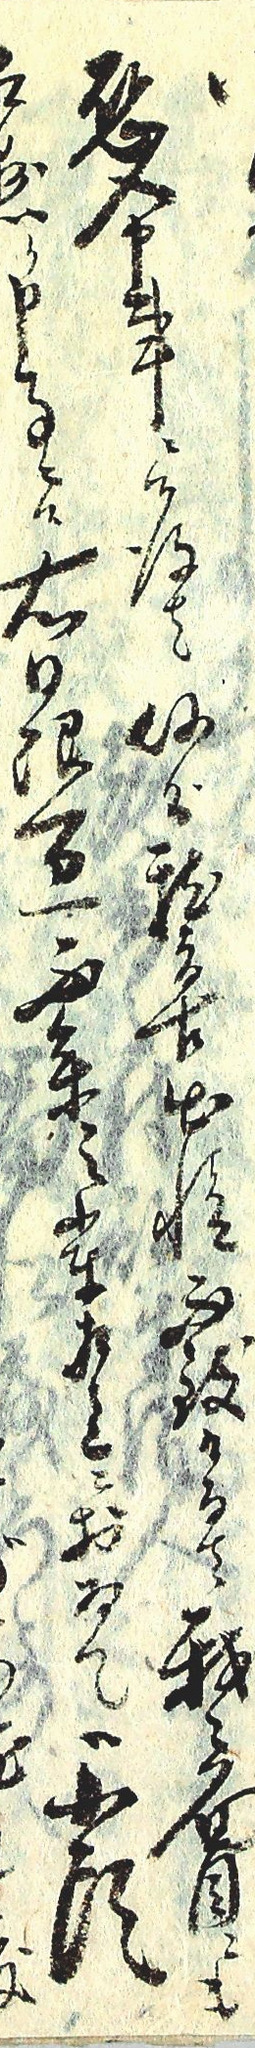相懸り申事に候右日限万一不参之輩有之におゐては小頭
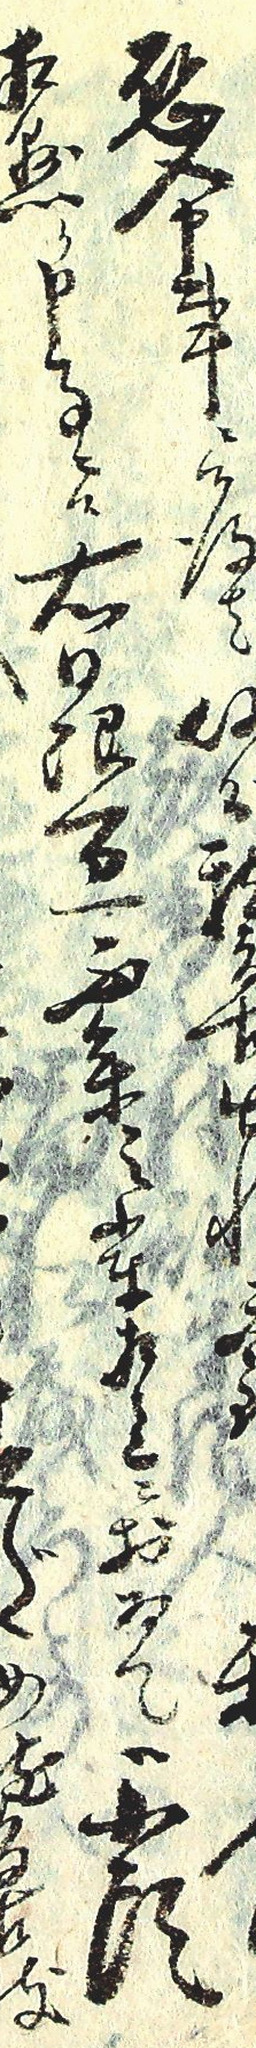相懸り申事に候右日限万一不参之輩有之におゐては小頭
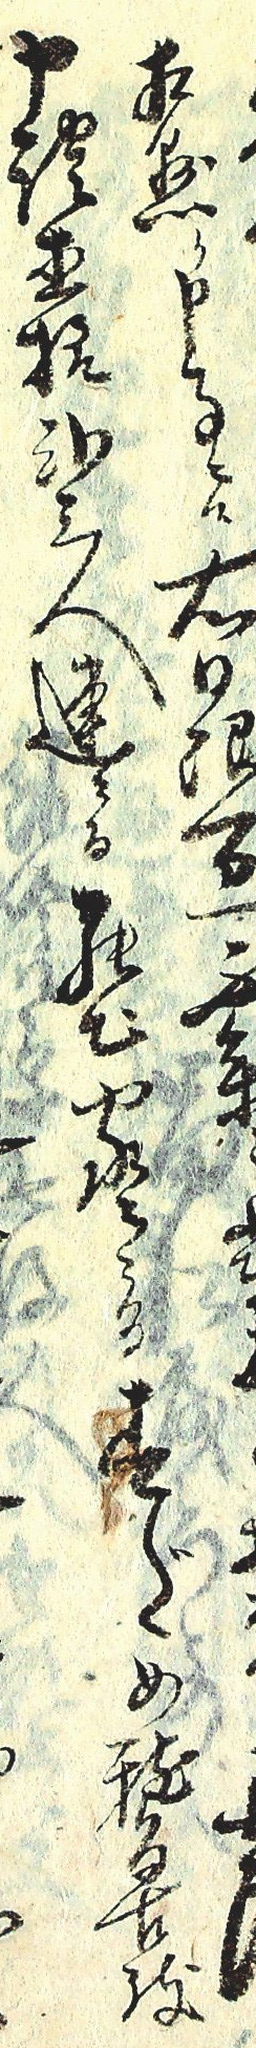申談直様弐三人連にて罷出家々にてすだめ稽古致
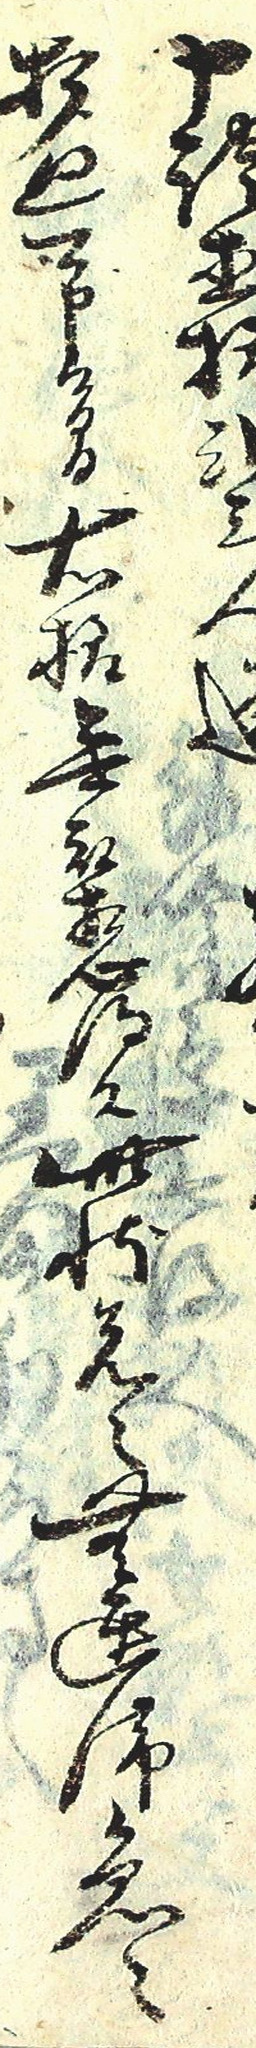相廻可申候間右様に可被相心得候此状先々無遅滞急々
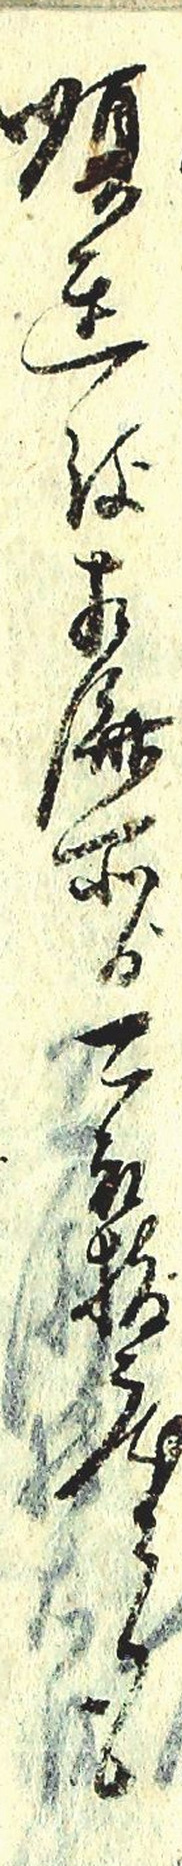順達致相済所ゟ可被指戻候以上
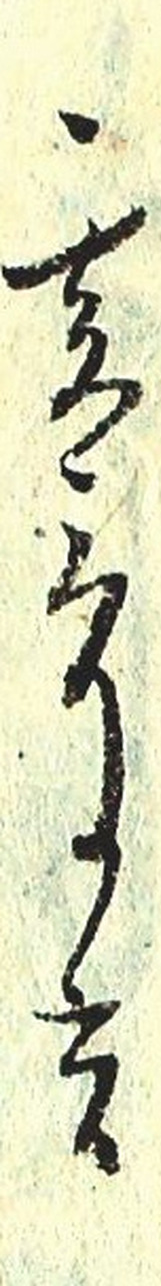亥三月六日
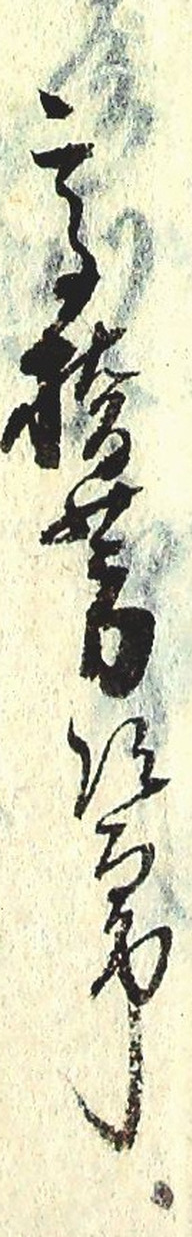高橋芳次郎
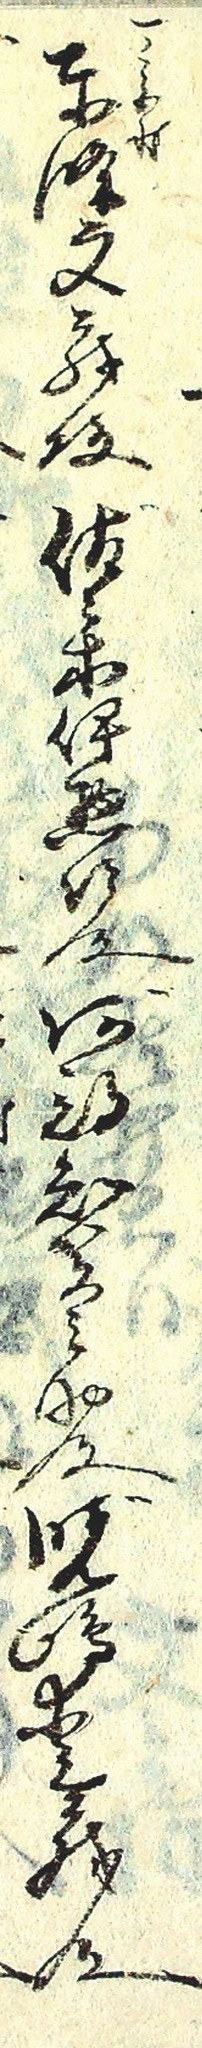東条文蔵殿佐々木伊惣次殿阿部知賀之助殿児島愛蔵殿
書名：諸御願書控(弐番）
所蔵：鳴門教育大学 Naruto University of Education
